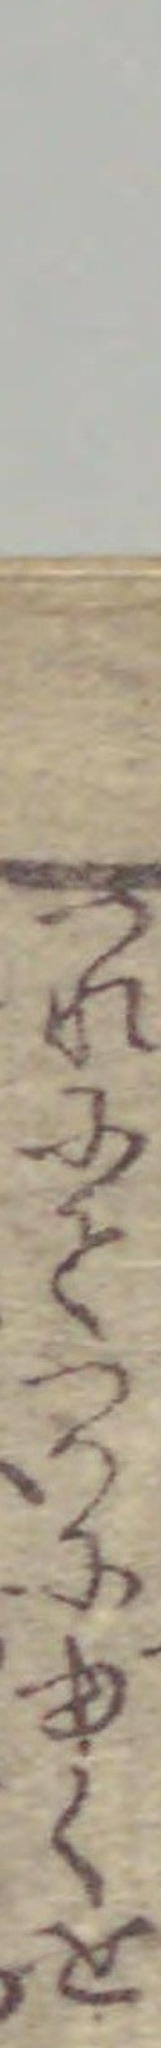つれにてつりにゆくを
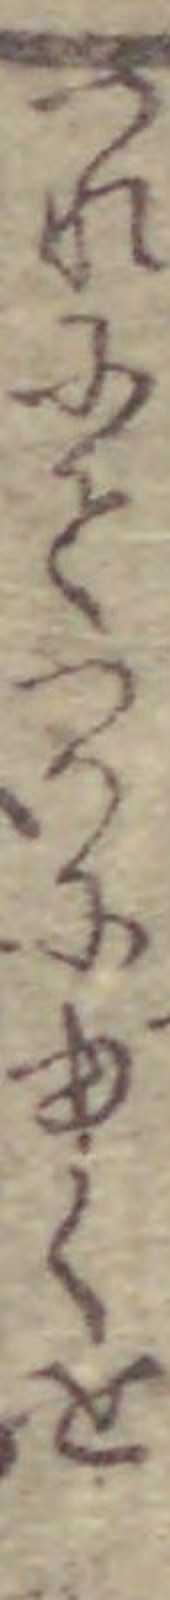つれにてつりにゆくを
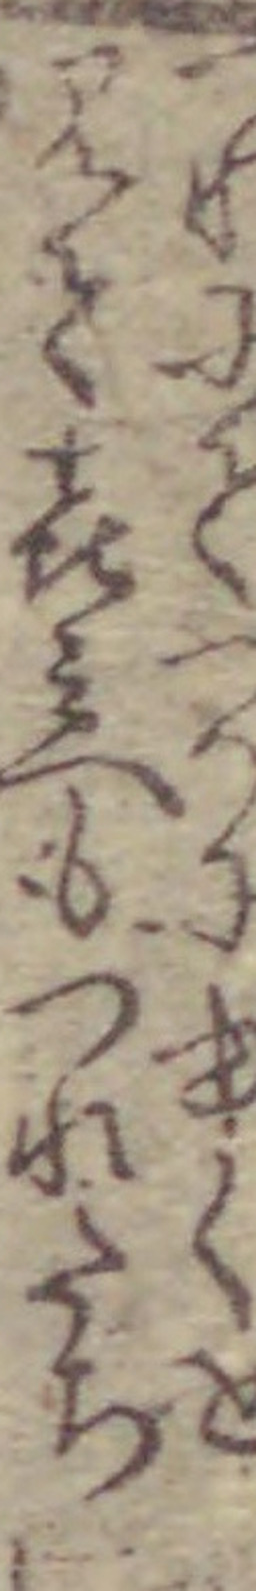見て喜兵へもつれたち
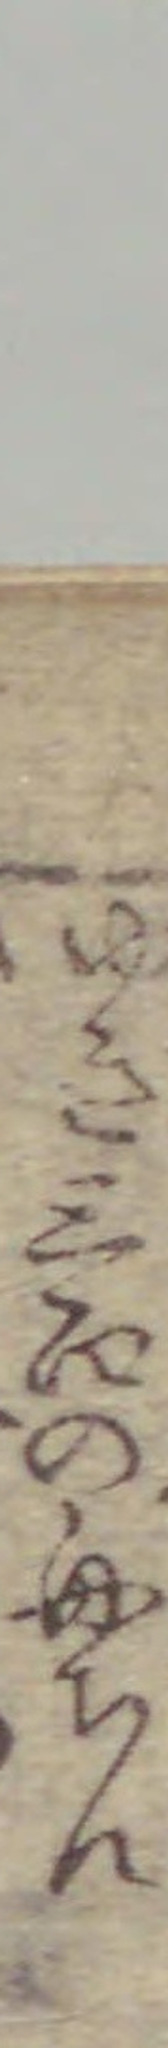ゆき三百の舟ちん
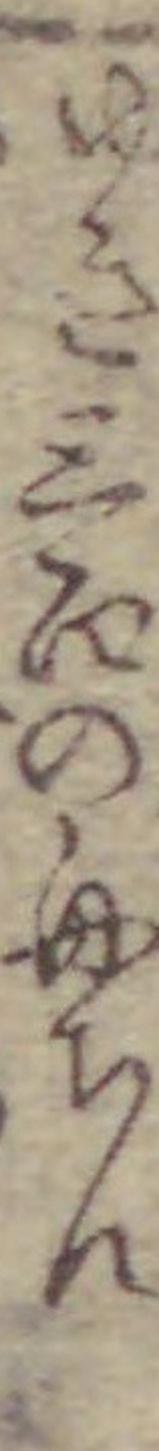ゆき三百の舟ちん
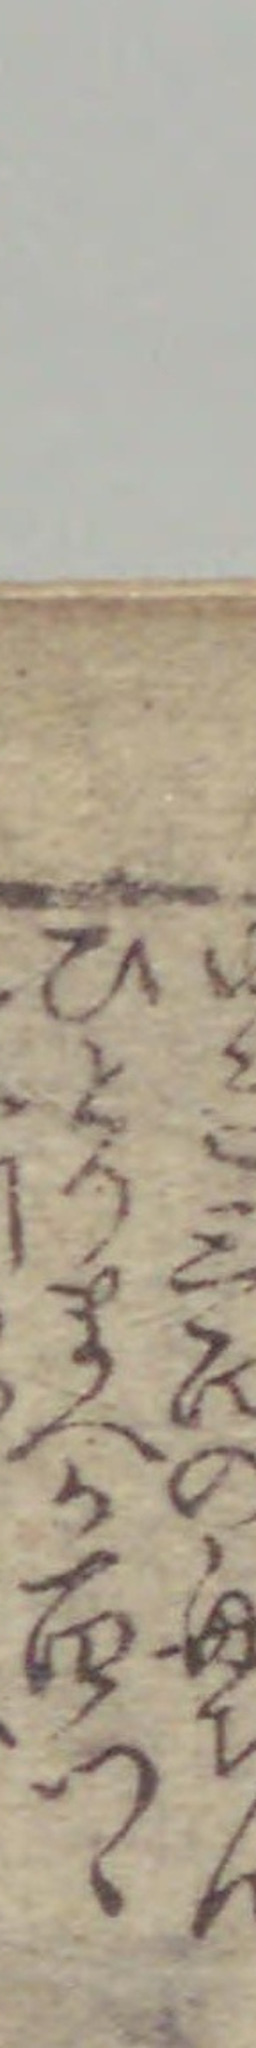ひとりまへか百つゝ
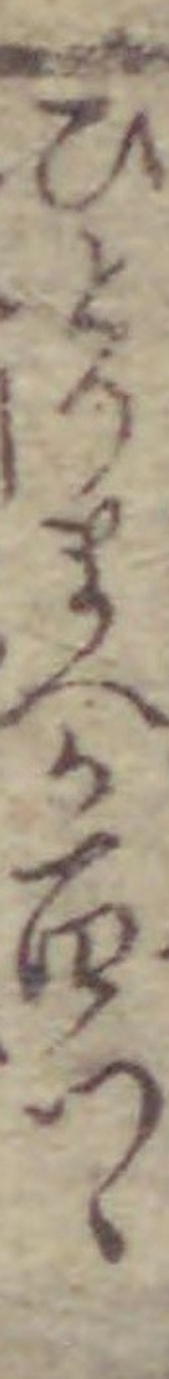ひとりまへか百つゝ
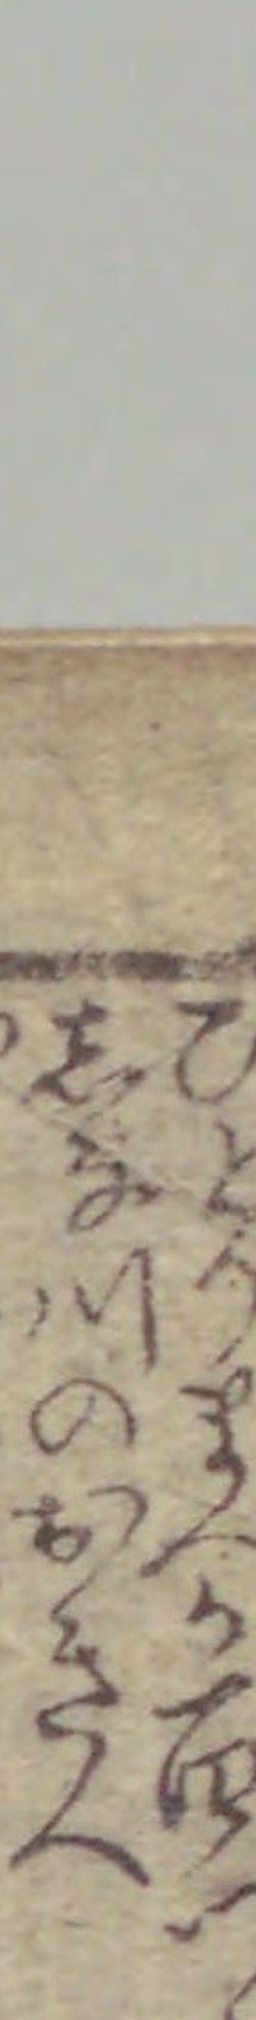しな川のおきへ
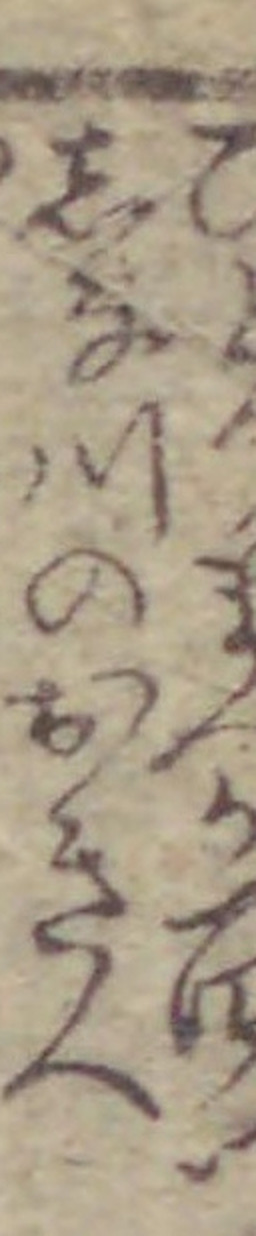しな川のおきへ
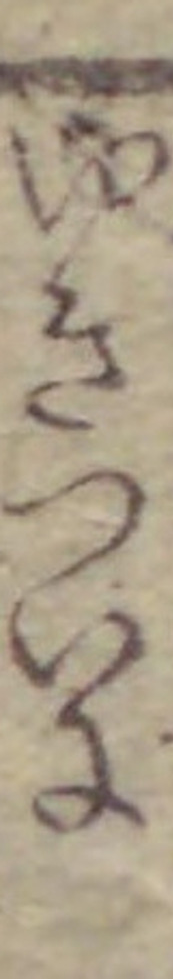ゆきついに
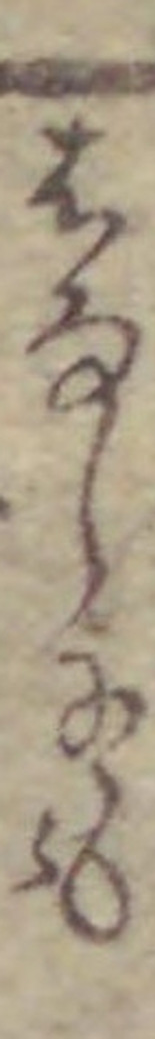はなしにも
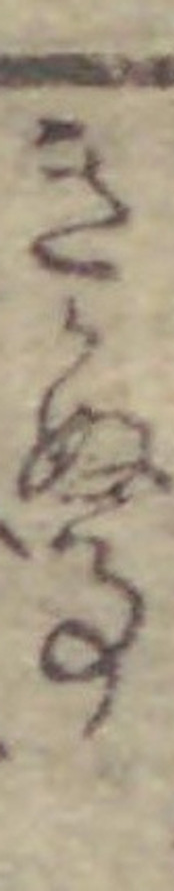きかぬ事
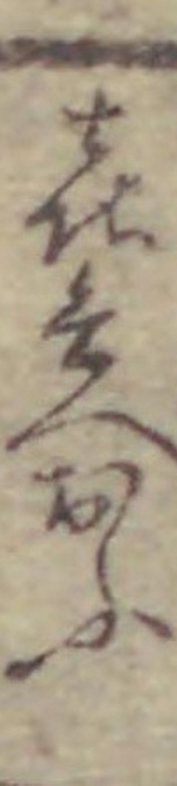喜兵へおふ
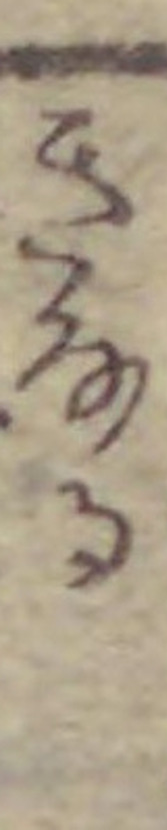きな事
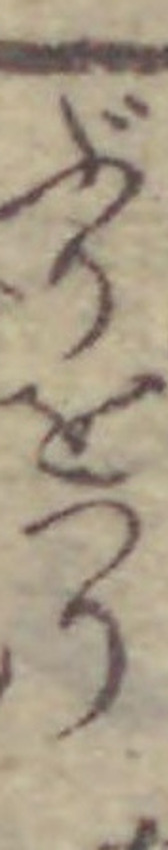ぶりをつり
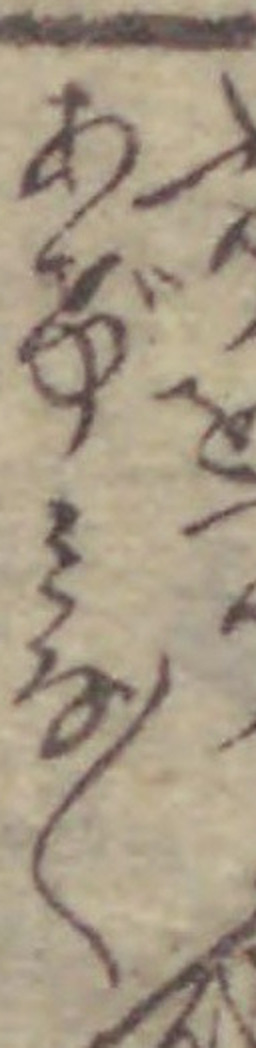あげみな〳〵
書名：親父布子鳶握 3巻
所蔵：国立国会図書館 National Diet Library, JAPAN
